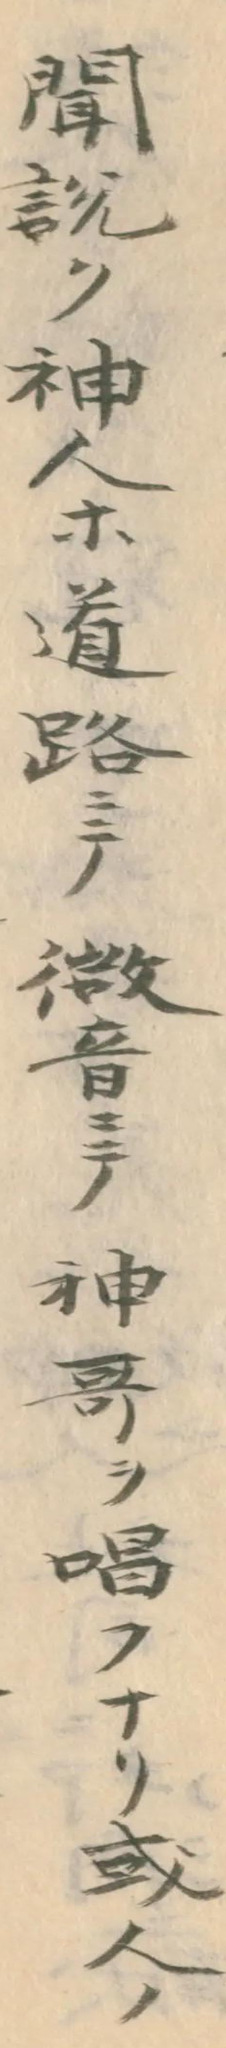聞説ク神人等道路ニテ微音ニテ神哥ヲ唱フナリ或人ノ
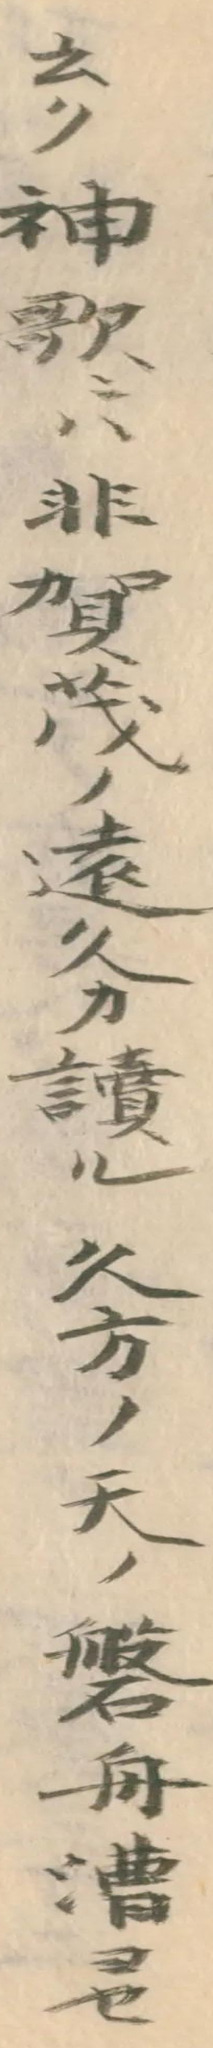云ク神歌ニハ非賀茂ノ遠久カ読ル久方ノ天ノ磐舟漕ヨセ
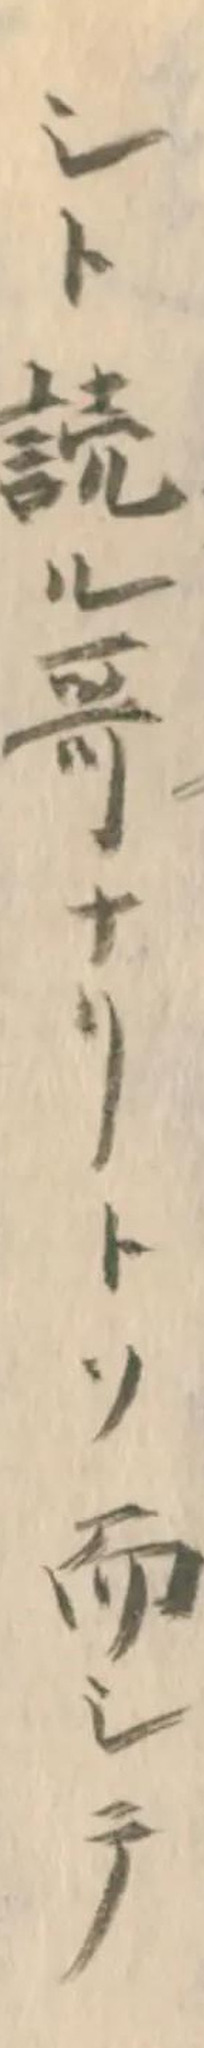シト読ル哥ナリトソ而シテ
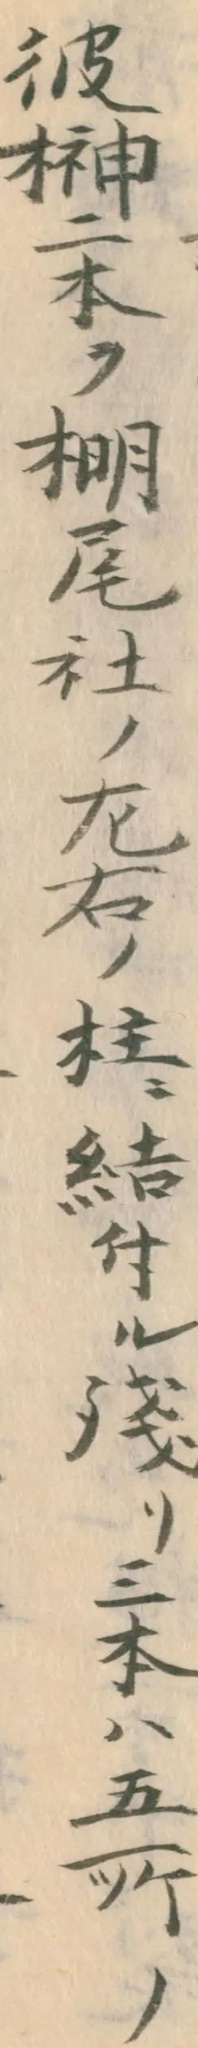彼榊二本ヲ棚尾社ノ左右ノ柱ニ結付ル残リ三本ハ五所ノ
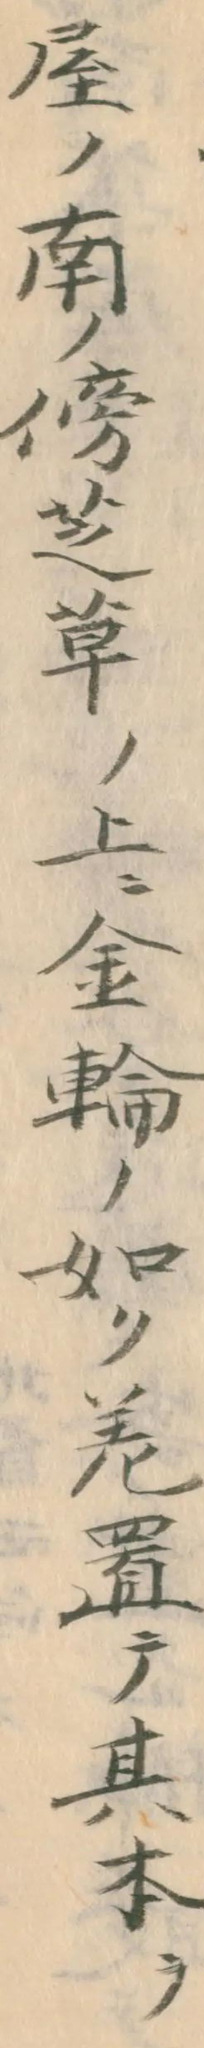屋ノ南ノ傍芝草ノ上ニ金輪ノ如ク差置テ其本ヲ
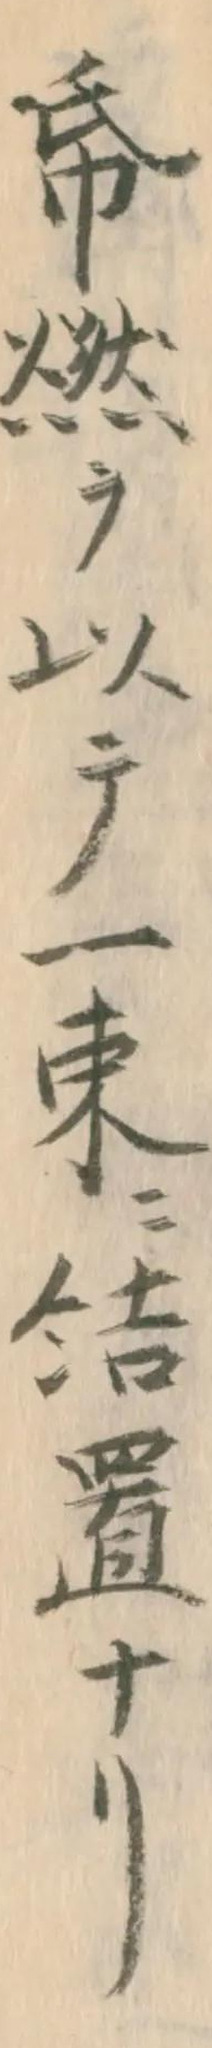紙燃ヲ以テ一束ニ結置ナリ
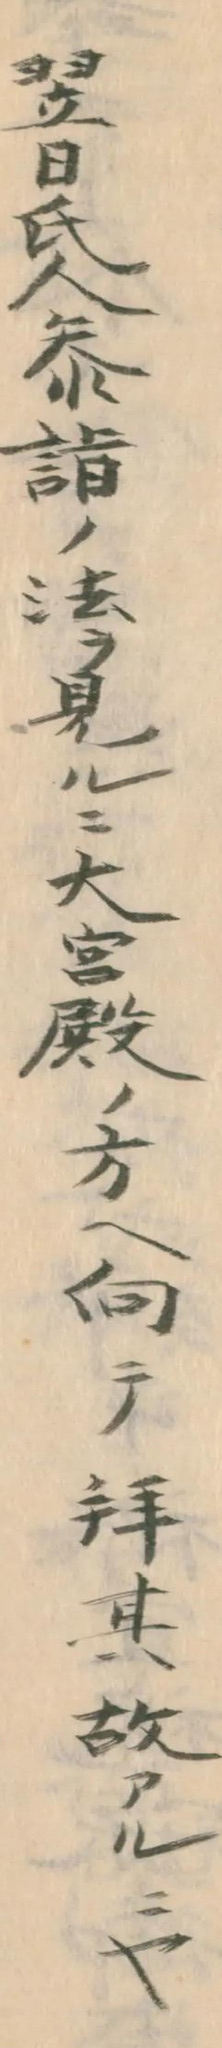翌日氏人参詣ノ法ヲ見ルニ大宮殿ノ方へ向テ拝其故アルニヤ
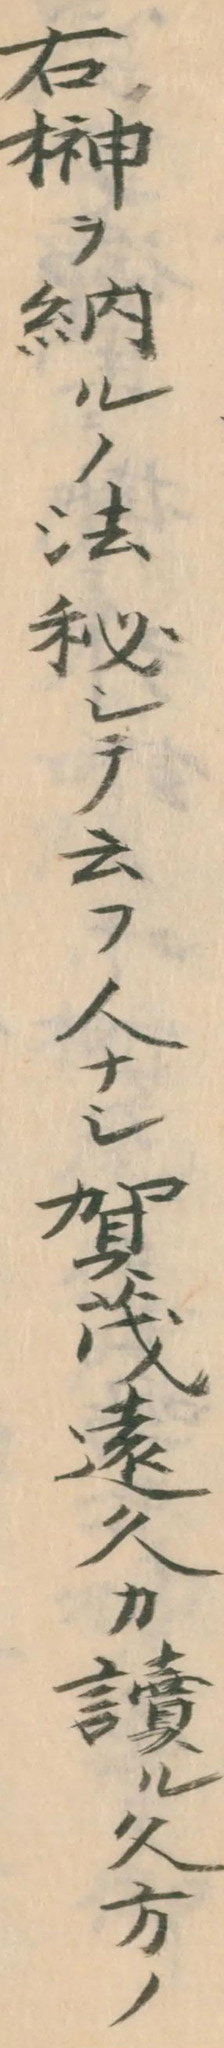右榊ヲ納ルノ法秘シテ云フ人ナシ賀茂遠久カ読ル久方ノ
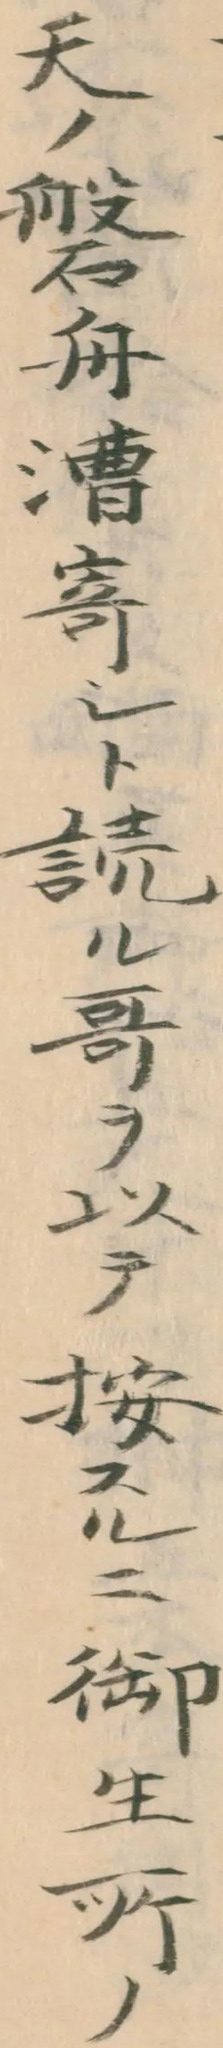天ノ磐舟漕寄シト読ル哥ヲ以テ按スルニ御生所ノ
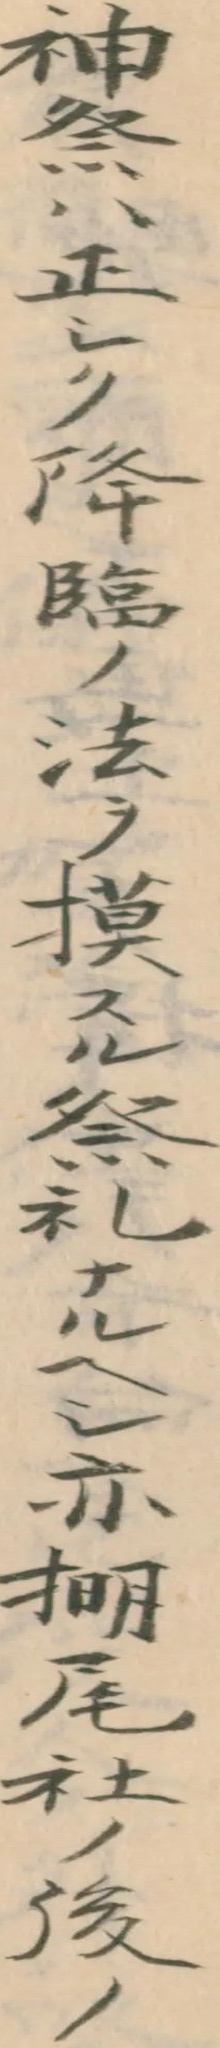神祭ハ正シク降臨ノ法ヲ模スル祭礼ナルヘシ亦棚尾社ノ後ノ
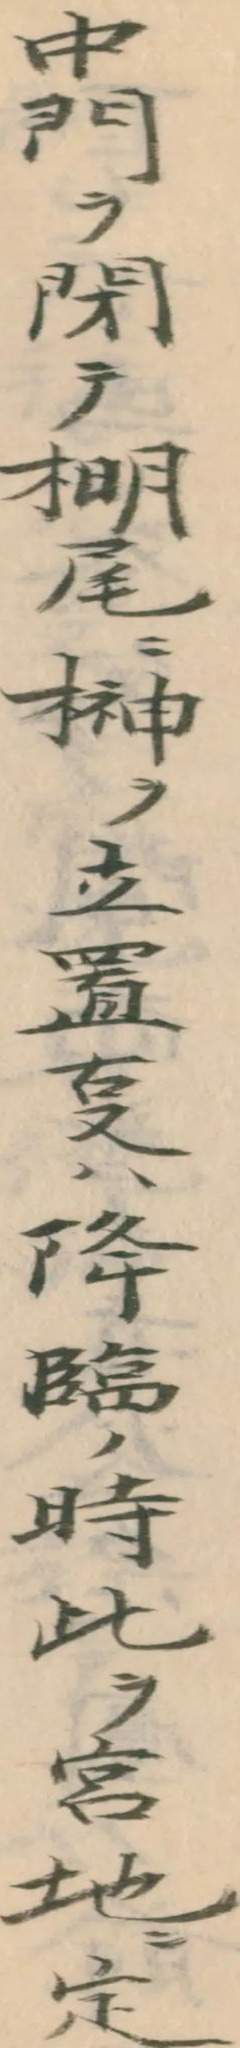中門ヲ閉テ棚尾ニ榊ノ立置事ハ降臨ノ時此ヲ宮地ニ定
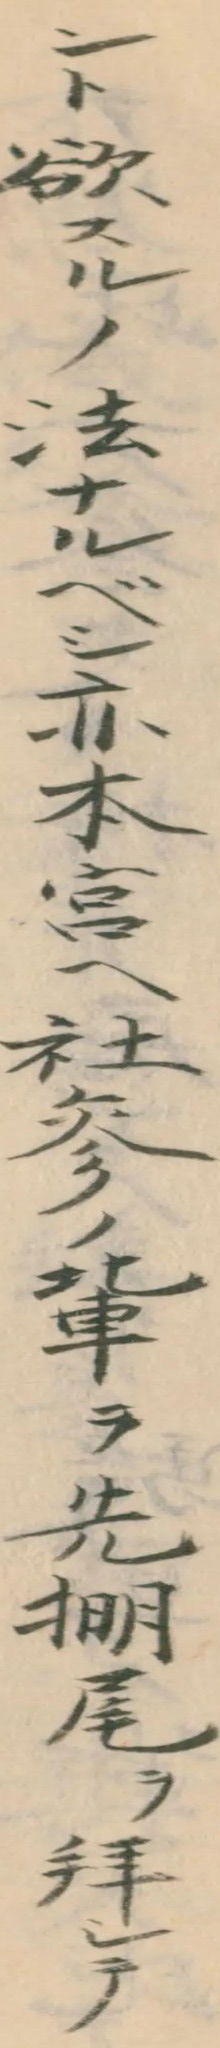ント欲スルノ法ナルベシ亦本宮ヘ社参ノ輩ヲ先棚尾ヲ拝シテ
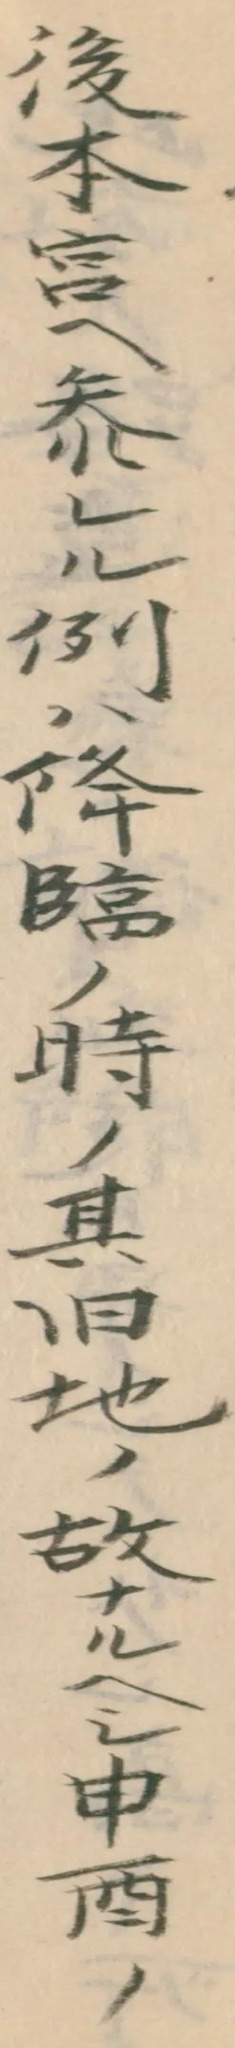後本宮ヘ参レル例ハ降臨ノ時ノ其旧地ノ故ナルヘシ申酉ノ
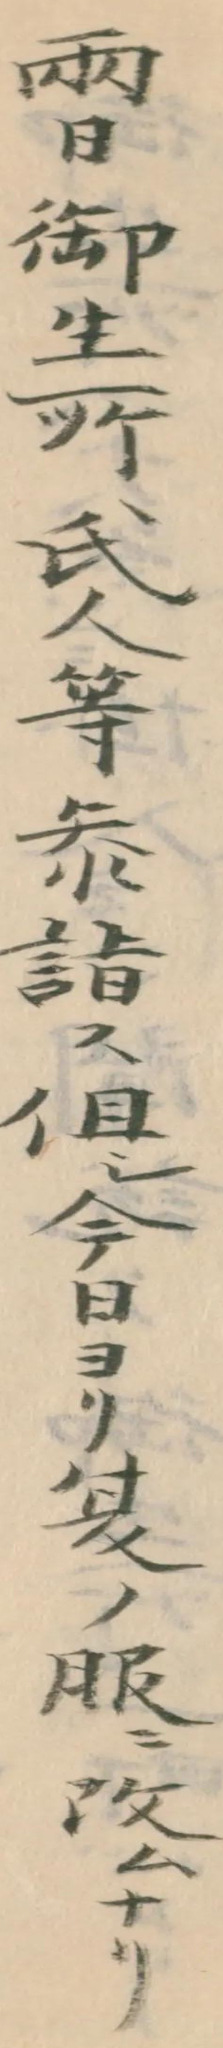両日御生所へ氏人等参詣ス但シ今日ヨリ夏ノ服ニ改ムナリ
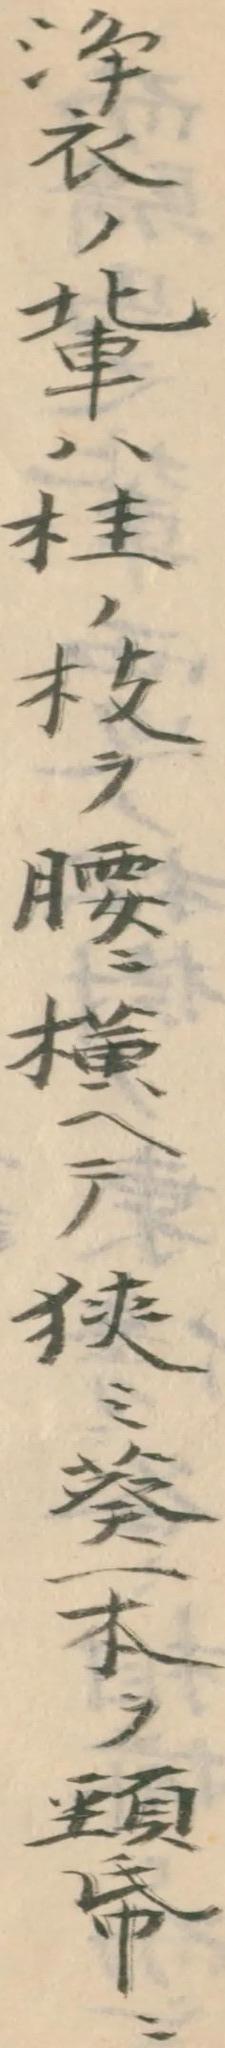浄衣ノ輩ハ桂ノ枝ヲ腰ニ横ヘテ挟ミ葵一本ヲ頭紙ニ
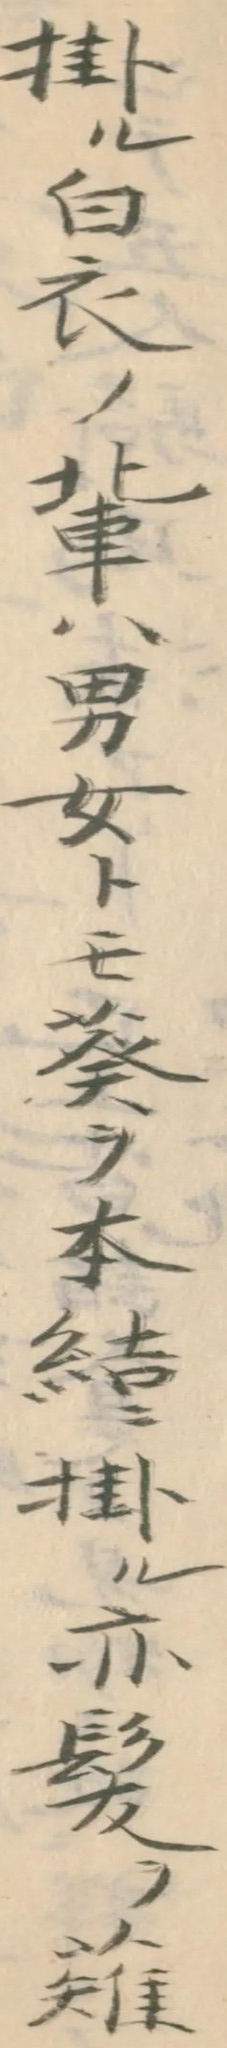掛ル白衣ノ輩ハ男女トモ葵ヲ本結ニ掛ル亦髪ノ薙
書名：賀茂社記録. 第91冊
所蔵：国立国会図書館 National Diet Library, JAPAN
